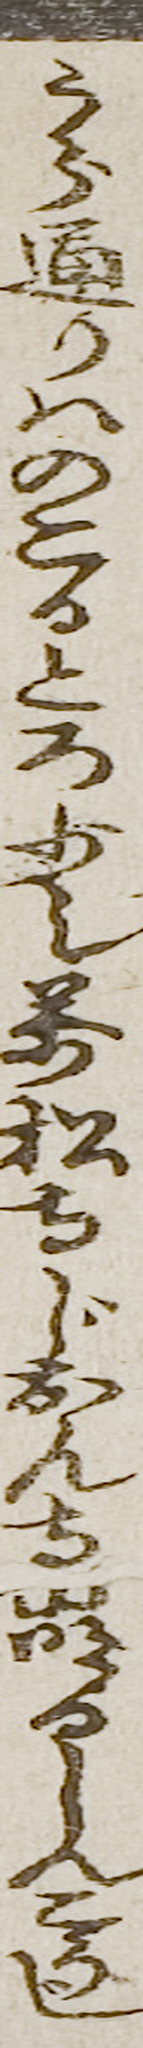うら通りはのこるとろ少シ茶松寺じおん寺崩るしんこうじ
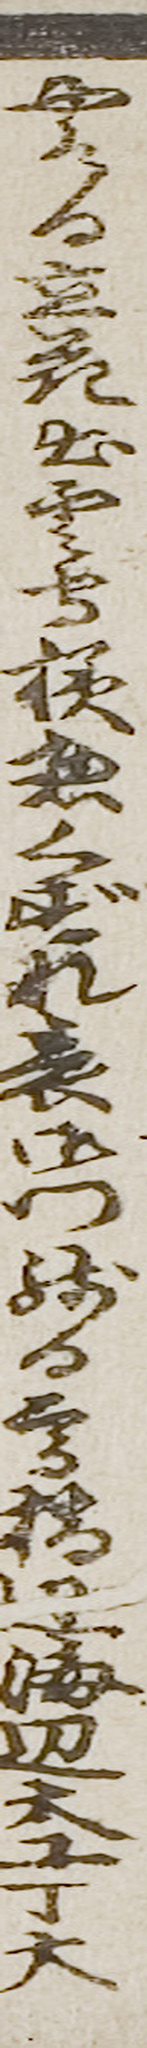やける立花出雲守様惣くずれ表御門残る高橋辺海辺大工丁大
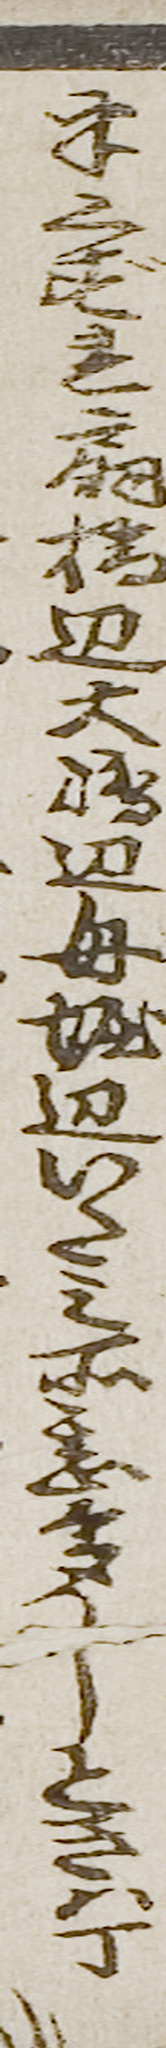半くずれ扇橋辺大島辺舟堀辺いたみ所々甚多しときは丁
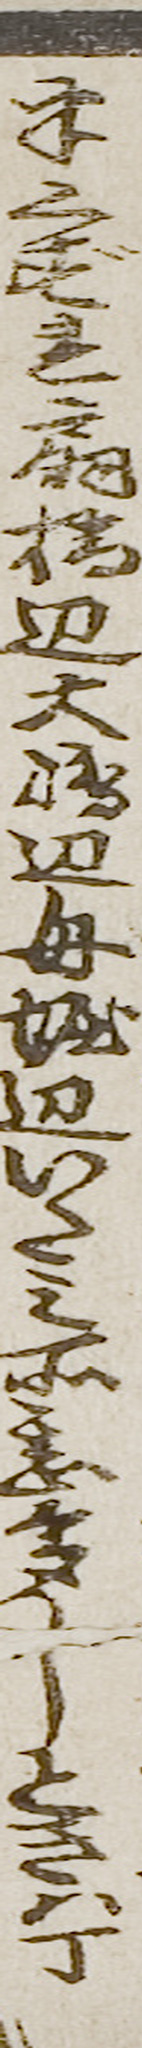半くずれ扇橋辺大島辺舟堀辺いたみ所々甚多しときは丁
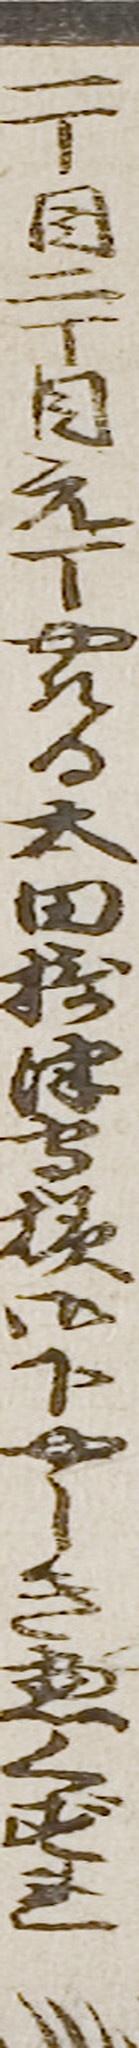一丁目二丁目元丁やける大田摂津守様御下やしき惣くずれ
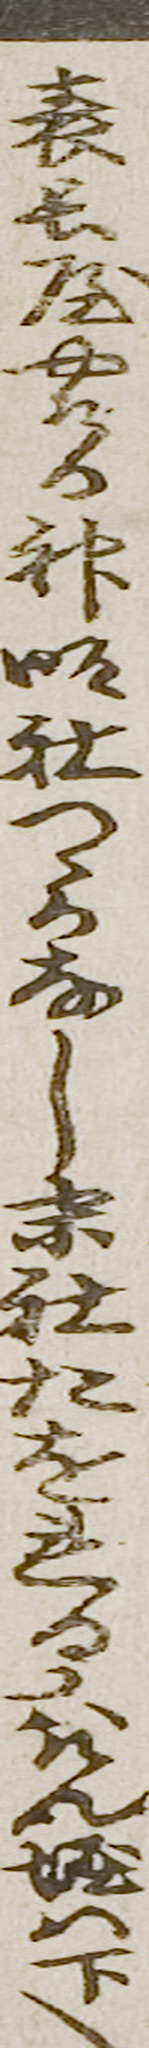表長屋やける神明社つゝかなし末社たをれる六けん堀は下
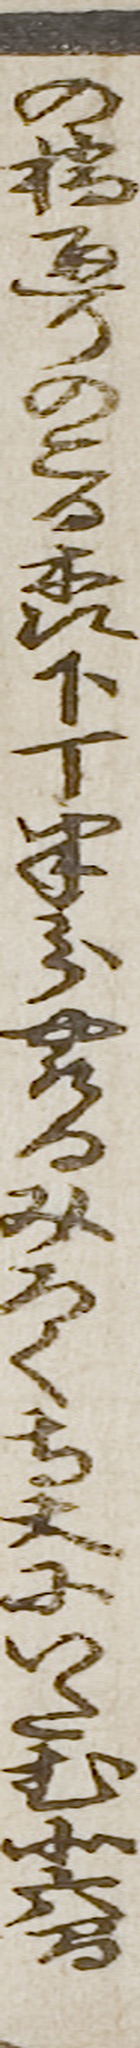の橋通りのこる森下丁半分やけるみろく寺大にいたむ北六間
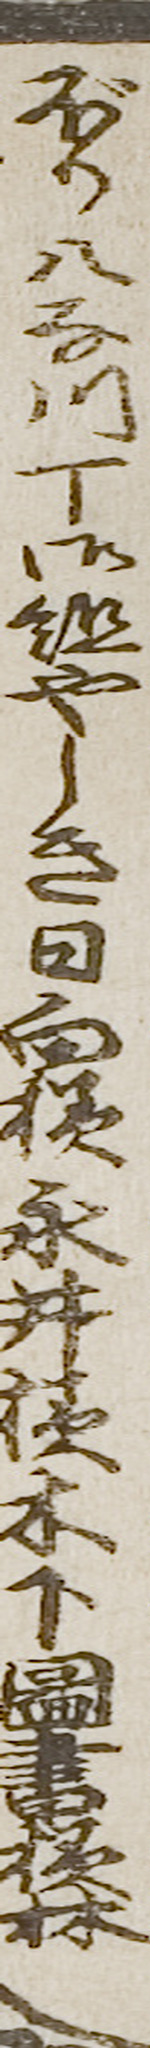ぼり八な川丁御組やしき日向様永井様木下図書様林
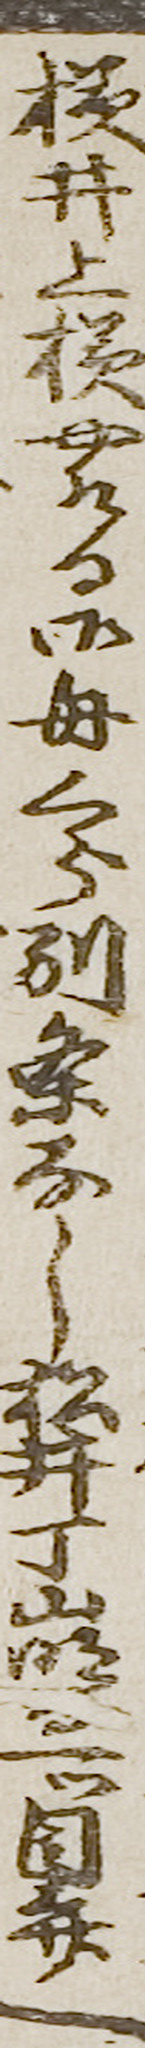様井上様やける御舟くら別条なし松井丁崩る一ツ目弁
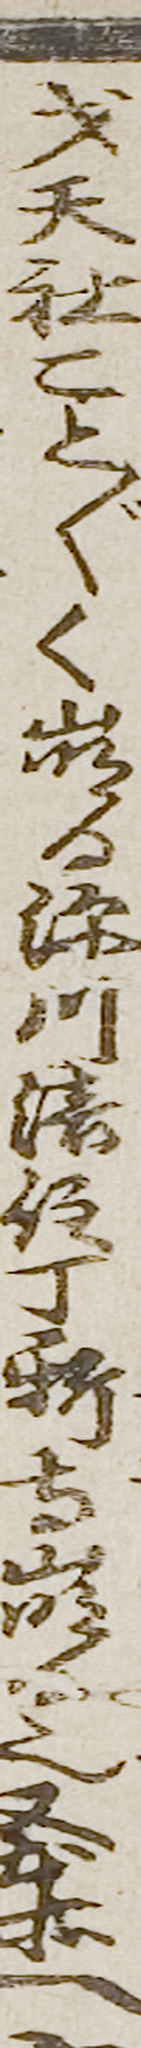才天社こと〴〵く崩る深川清住丁新寺崩る也又本所
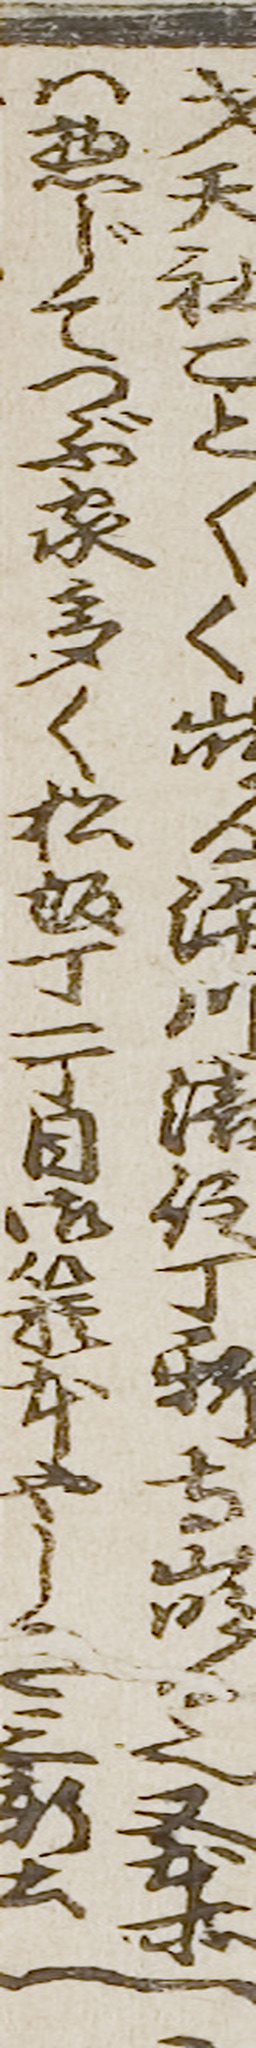は惣じてつぶ家多く松坂丁一丁目御旗本やしき三軒土
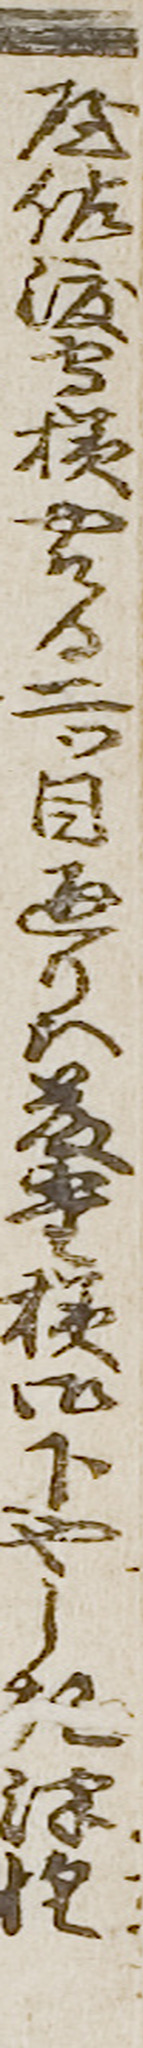屋佐渡守様やける二ツ目通りは藤堂様御下やしき津軽
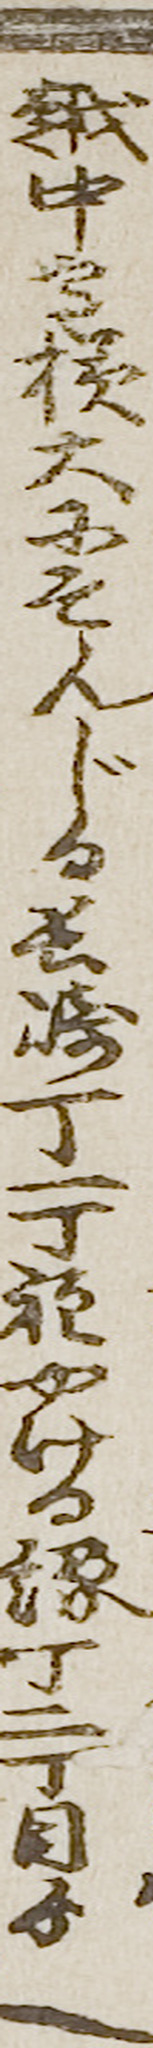越中守様大にそんじる長崎丁一丁程やける緑丁二丁目ゟ
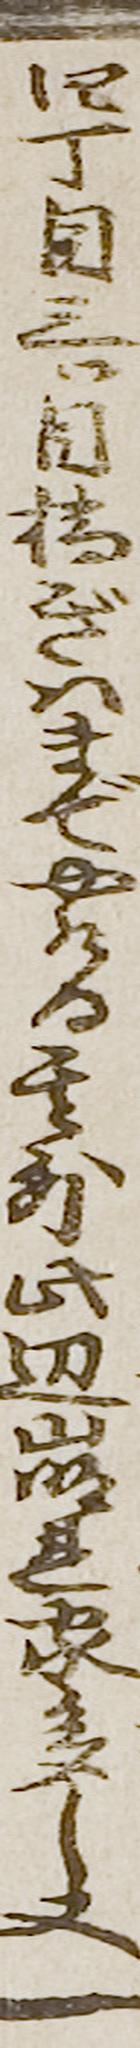四丁目三ツ目橋ぎはまでやける其外此辺崩れ家多し又
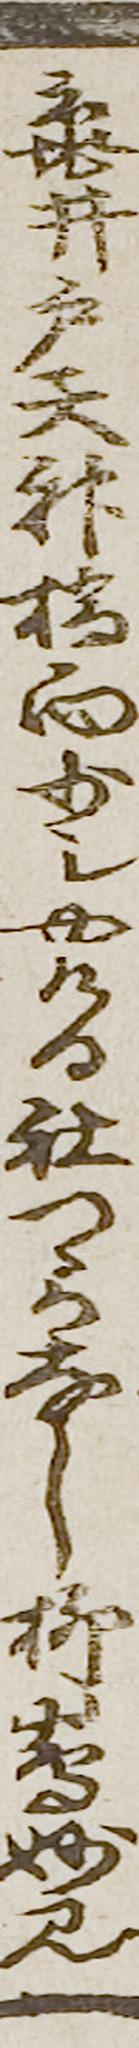亀井戸天神橋向少シやける社つゝかなし柳島妙見
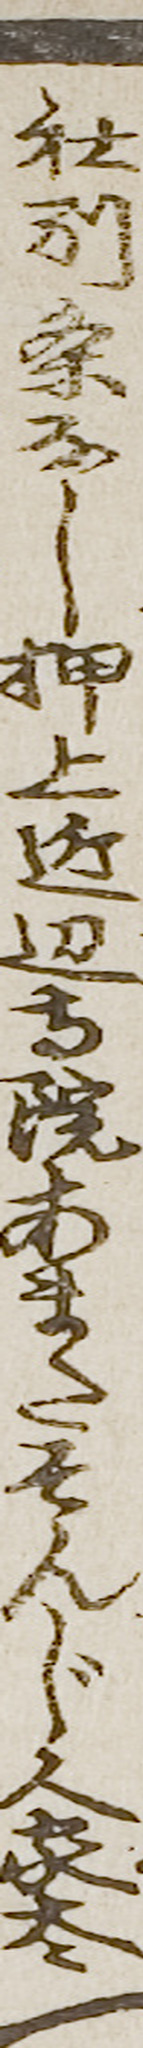社別条なし押上近辺寺院あまたそんじ人家大に
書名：安政改正泰平盤石図会
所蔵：東京大学総合図書館 General Library in the University of Tokyo, JAPAN
